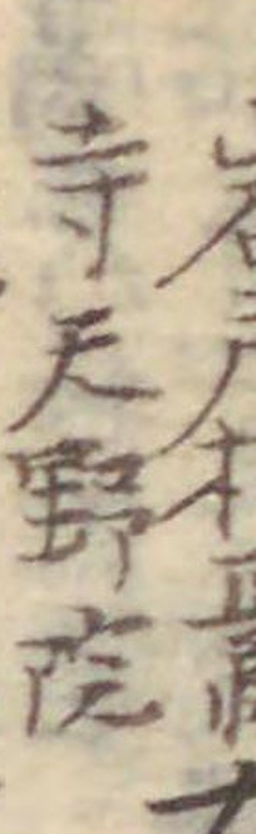寺天野院
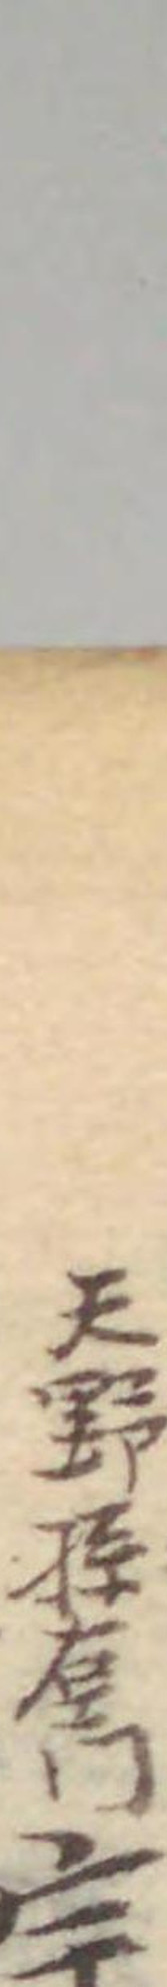天野孫右エ門
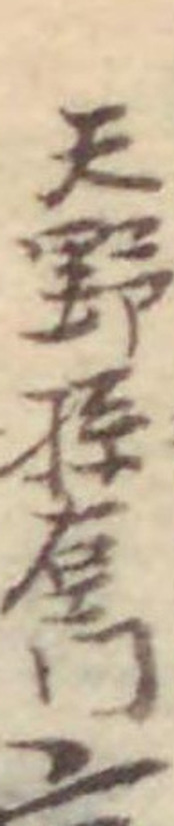天野孫右エ門
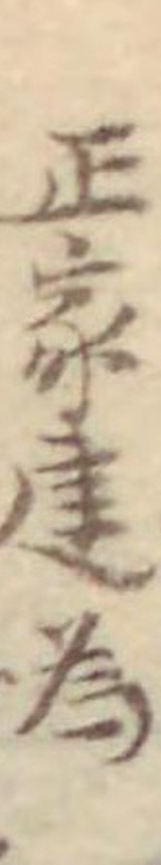正家建為
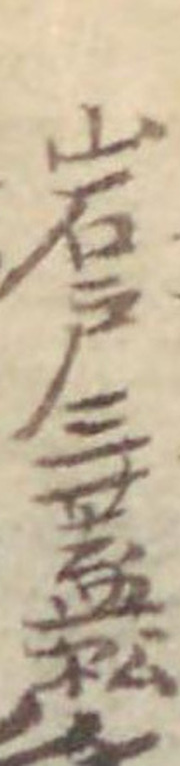岩戸三蓋松
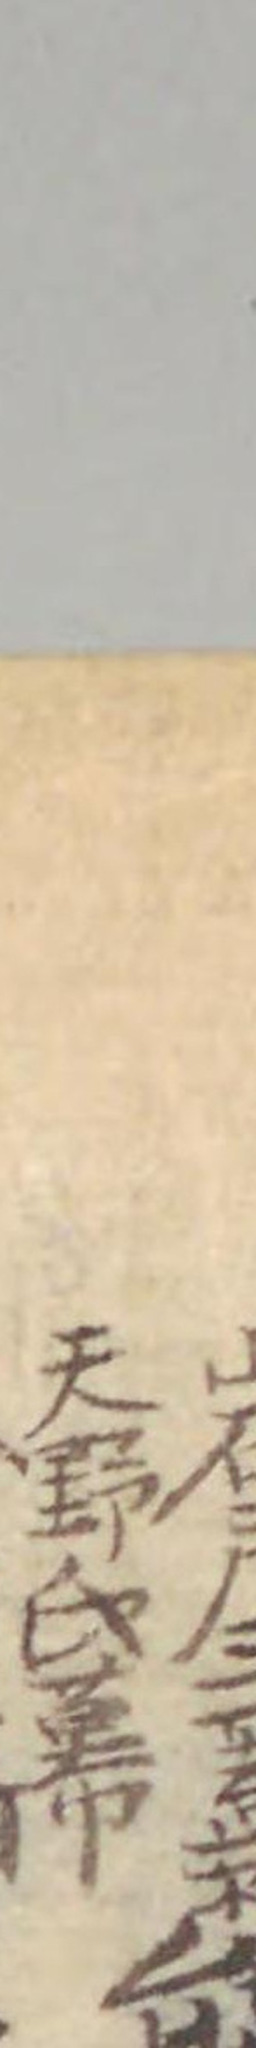天野氏幕
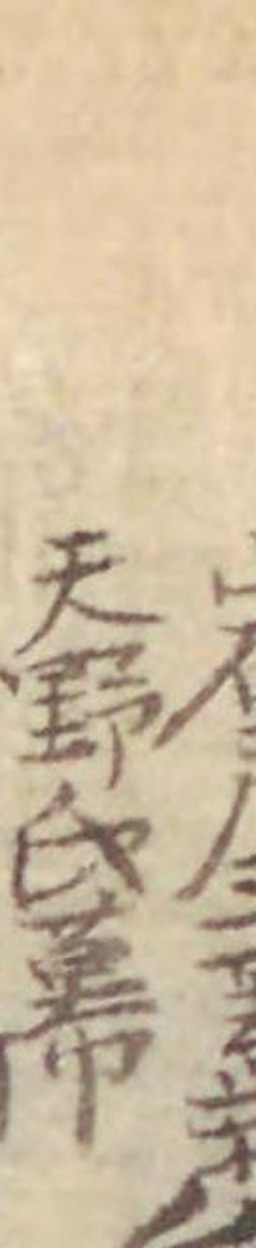天野氏幕
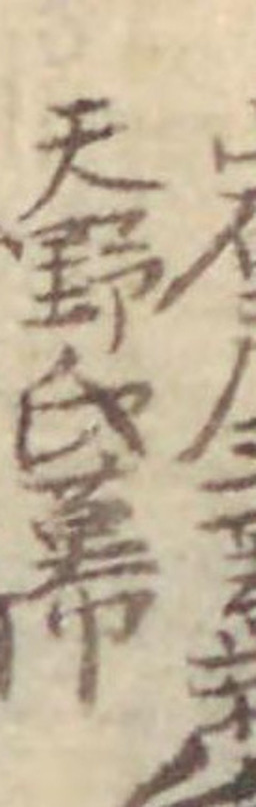天野氏幕
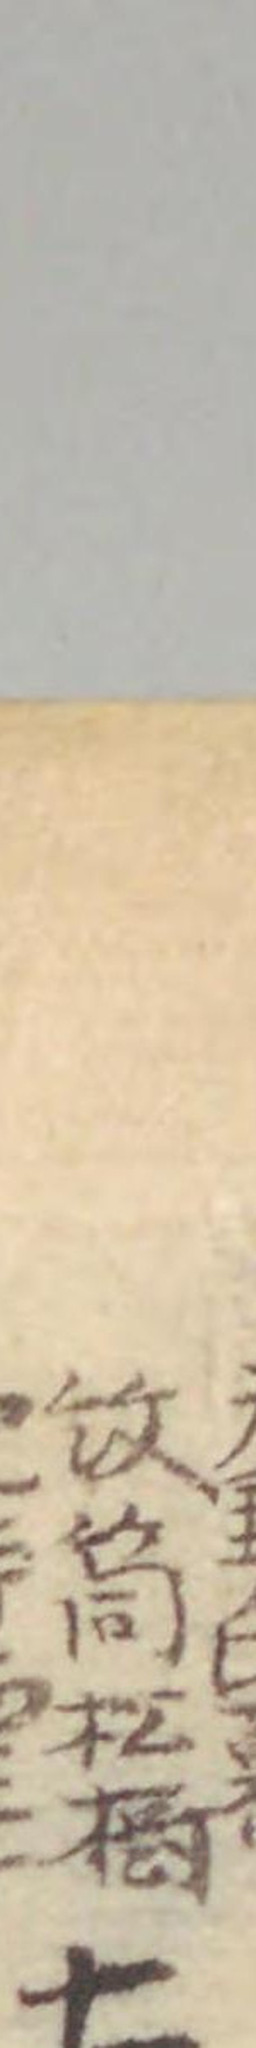紋筒松樹
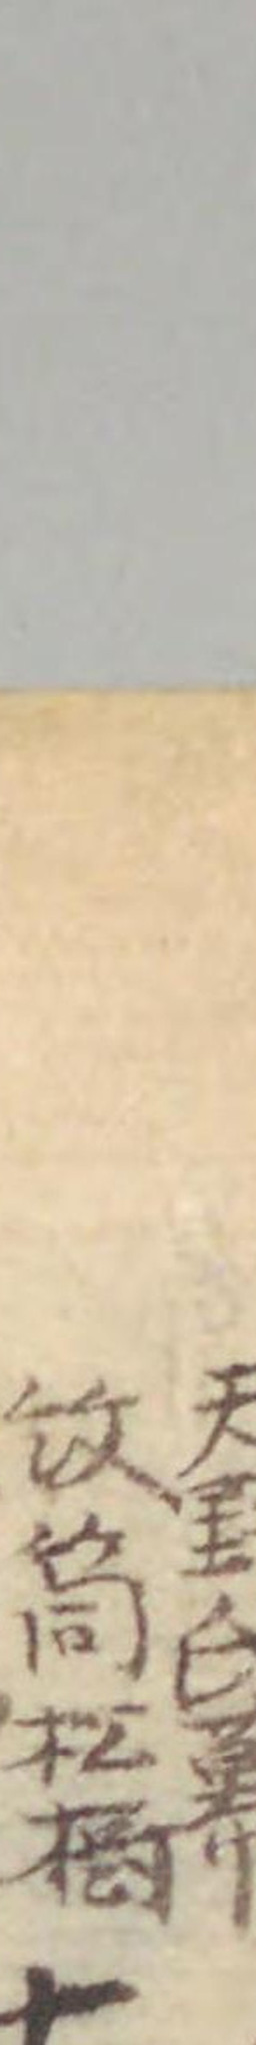紋筒松樹
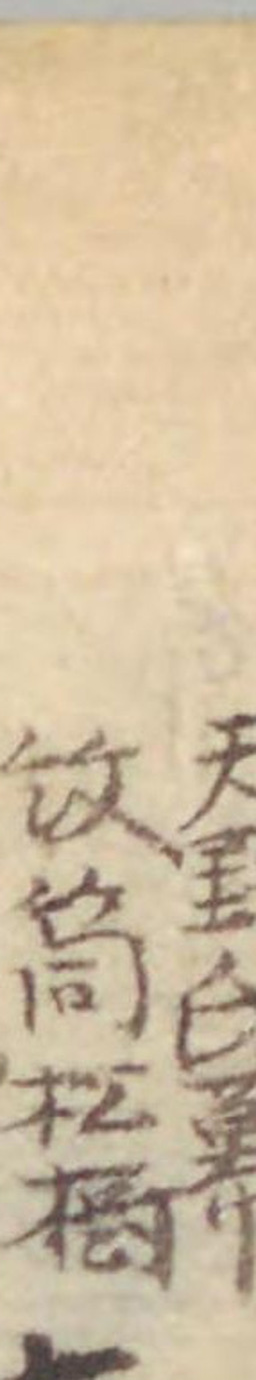紋筒松樹
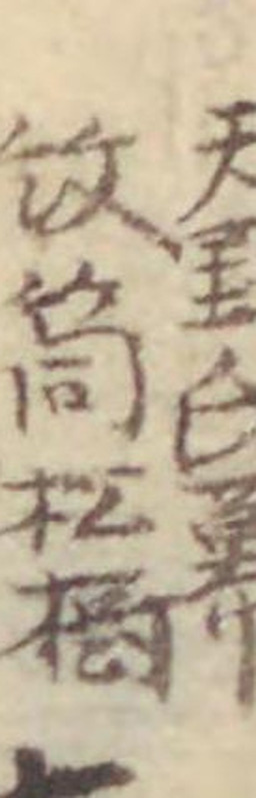紋筒松樹
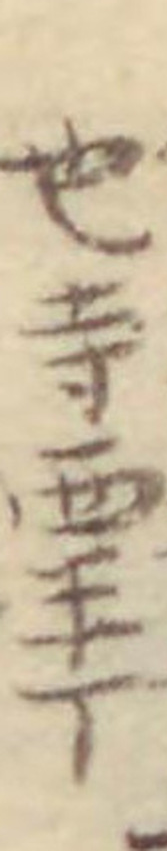也寺西手丁
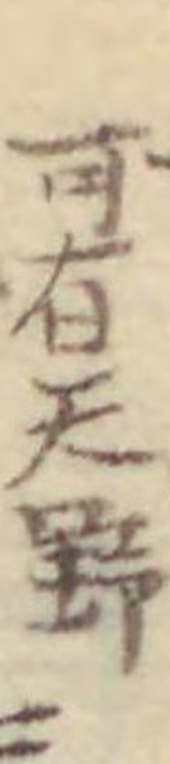可有天野
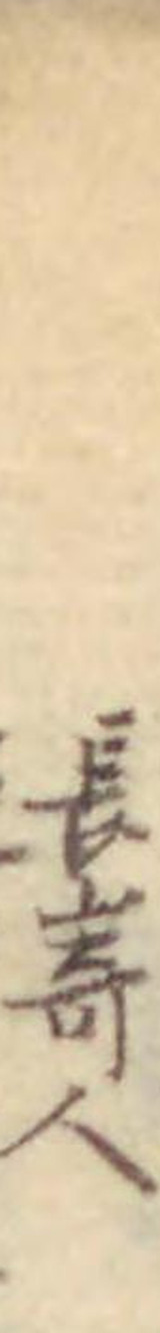長㟢人
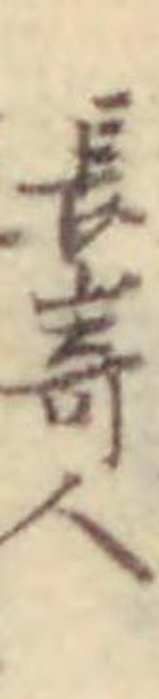長㟢人
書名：鶯宿雑記. 巻199-200
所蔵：国立国会図書館 National Diet Library, JAPAN
